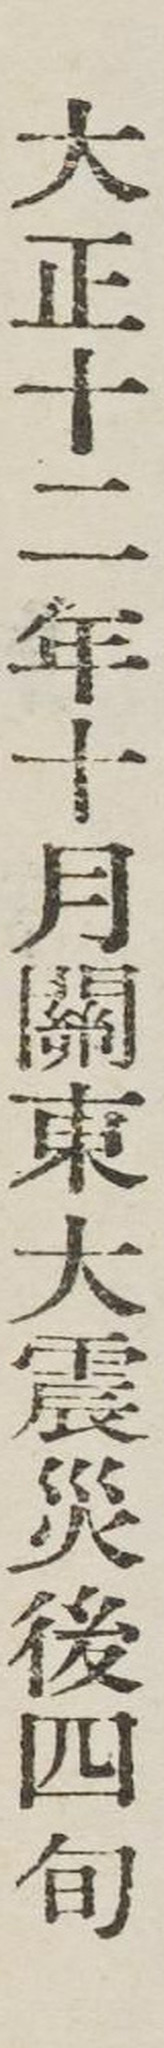大正二年十月関東大震災後四旬
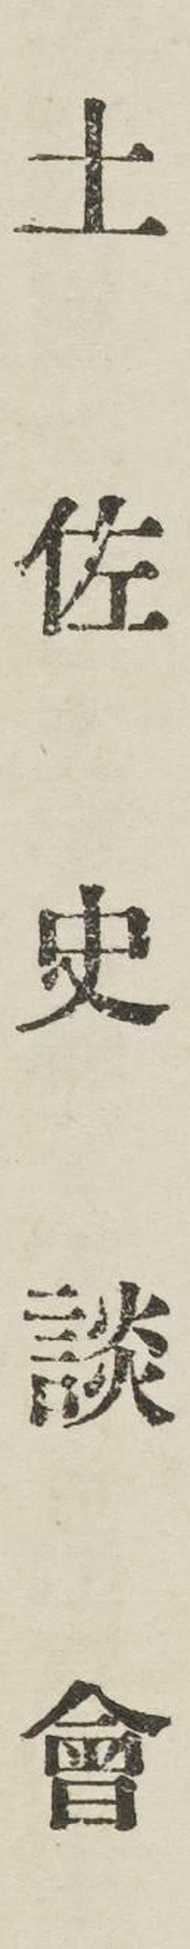土佐史談会

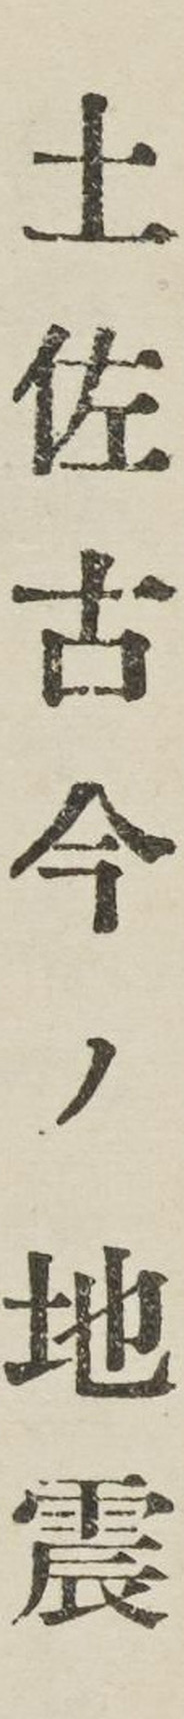土佐古今ノ地震
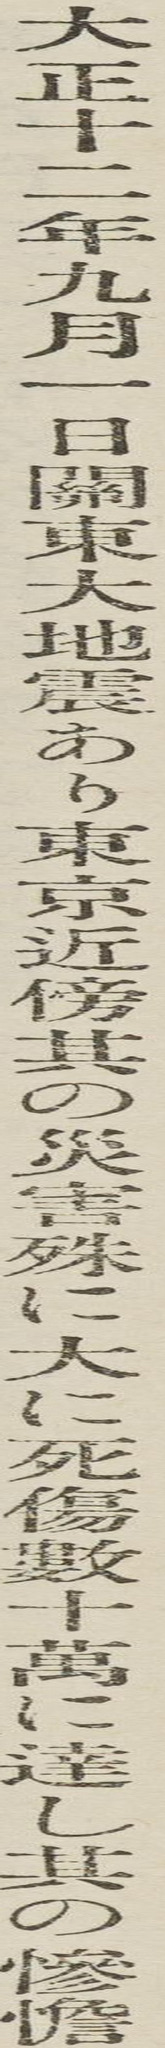大正二年九月一日関東大地震あり東京近傍其の災害殊に大に死傷数十万に達し惨憺
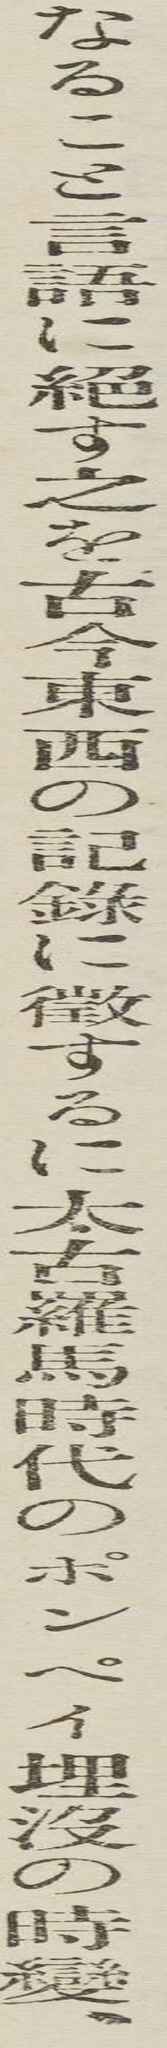なること言語に絶す之を古今東西の記録に徴するに太古羅馬時代のポンペイ埋没の時変、
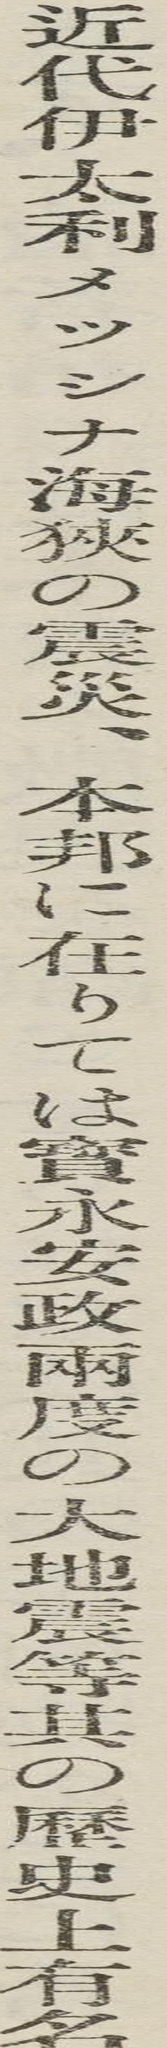近代伊太利メツシナ海峡の震災、本邦に在りては宝永安政両度の大地震等其の歴史上有名
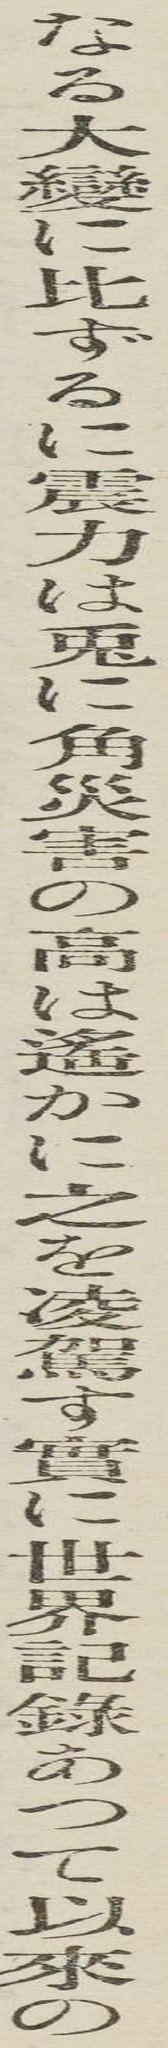なる大変に比ずるに震力は兎に角災害の高は遙かに之を凌駕す実に世界記録あつて以来の
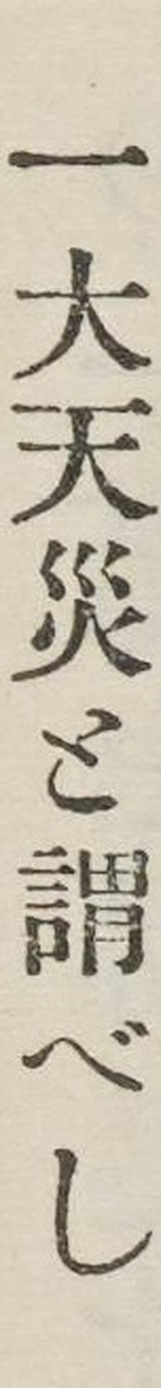一大天災と謂べし
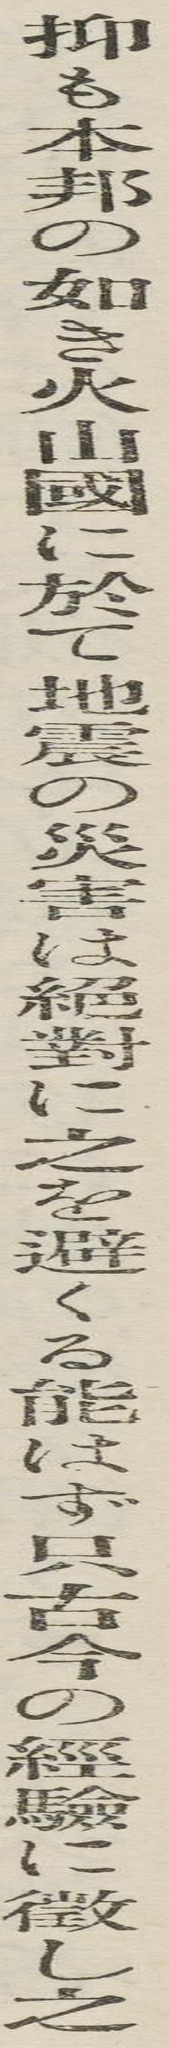抑も本邦の如き火山国に於て地震の災害は絶対に之を避けくる能はず只古今の経験に徴し之
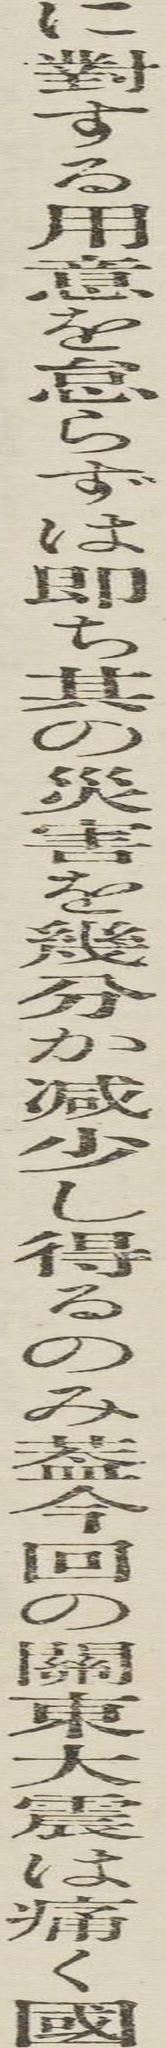に対する用意を怠らずは即ち其の災害を幾分か減少し得るのみ葢今回の関東大震は痛く国
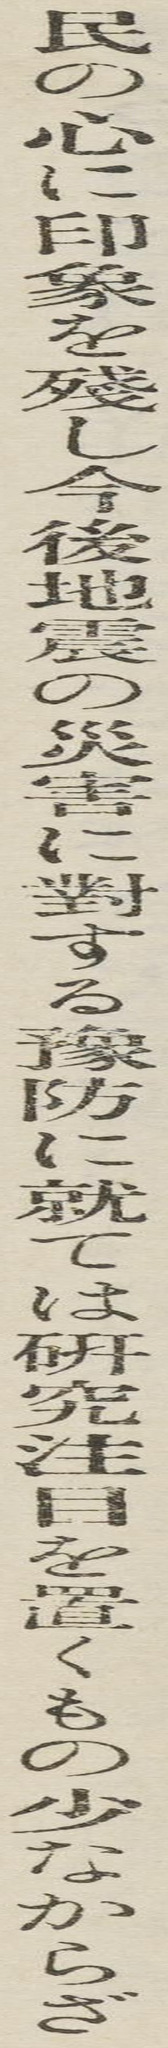民の心に印象を残し今後地震の災害に対する予防に就ては研究注目を置くもの少なからざ
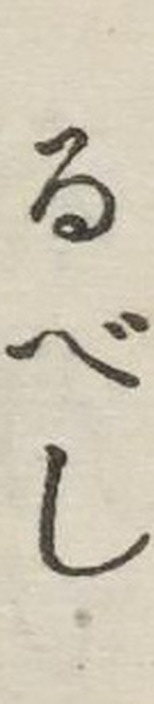るべし
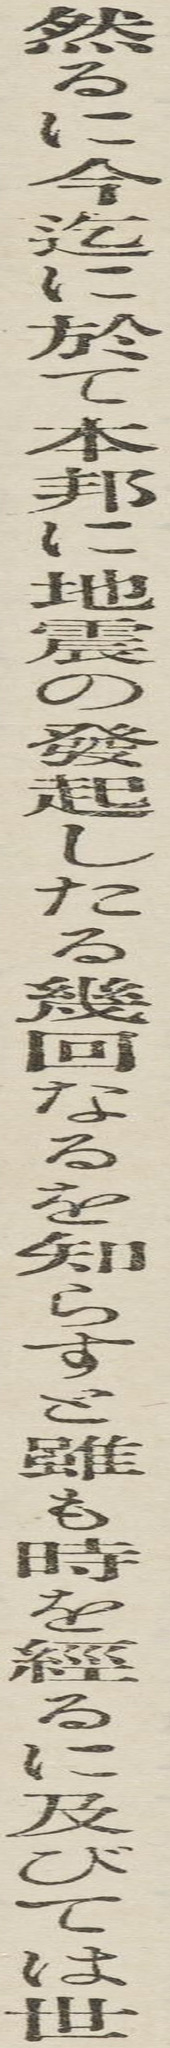然るに今迄に於て本邦に地震の発起したる幾回なるを知らすと雖も時を経るに及びては世
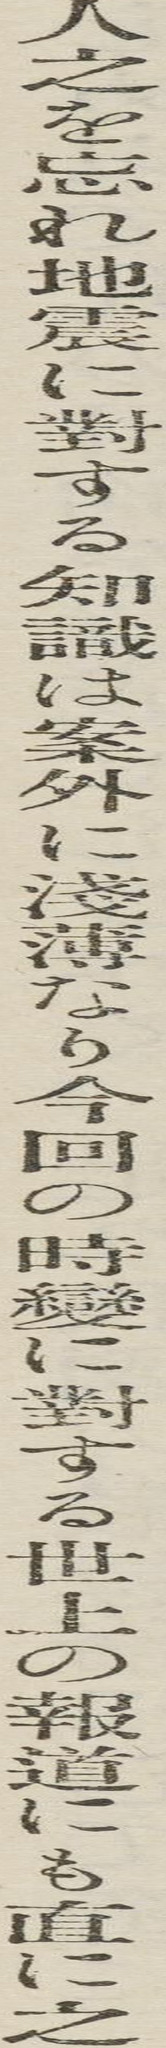人之を忘れ地震に対する知識は案外に浅薄なり今回の時変に対する世上の報道にも直に之
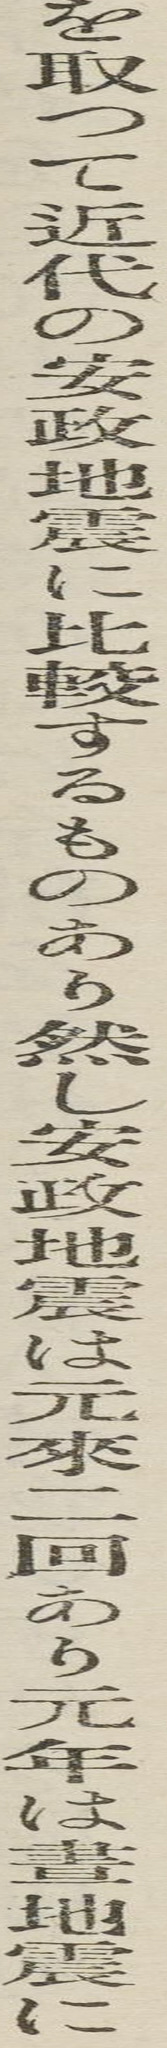を取つて近代の安政地震に比較するものあり然し安政地震は元来二回あり元年は昼地震に
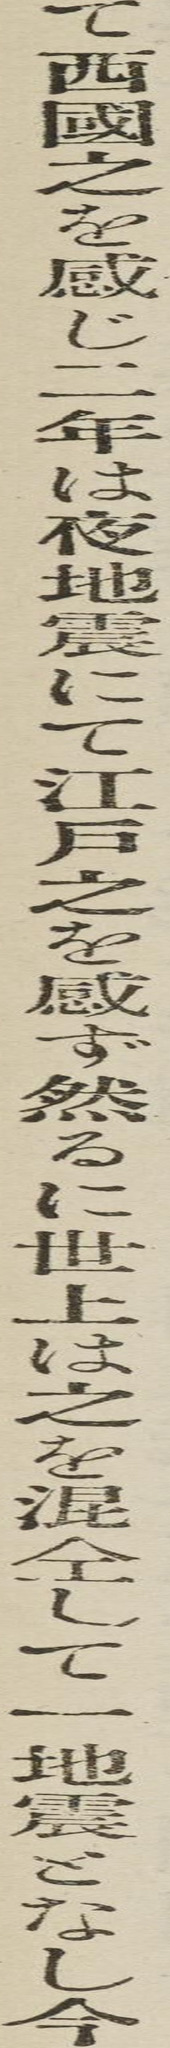て西国之を感じ二年は夜地震にて江戸之を感ず然るに世上は之を混同して一地震となし今
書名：土佐古今ノ地震
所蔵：東京大学地震研究所図書室 Earthquake Research Institute Library, The University of Tokyo, JAPAN
